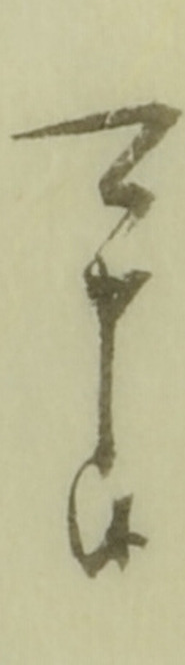可申候
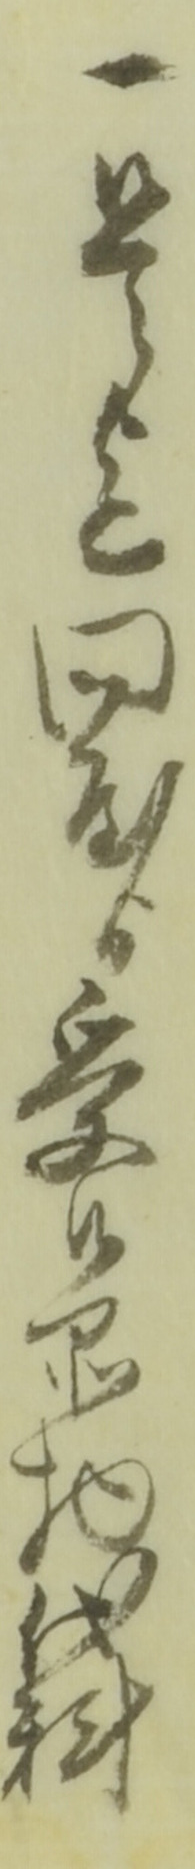一是迄問屋ゟ受候品物代料
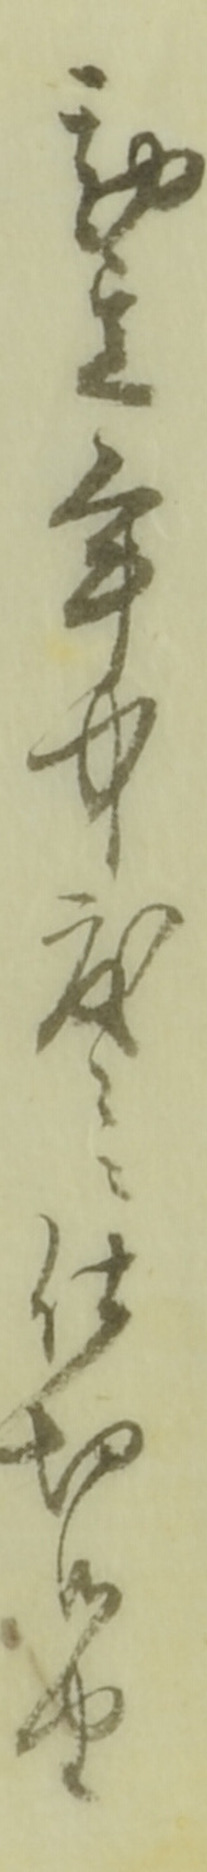勘定年中度々ニ仕切候由
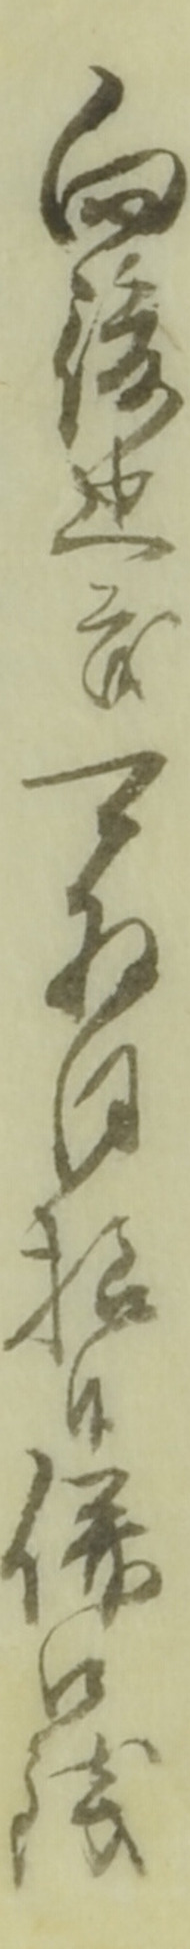向後迚茂可為同様候併口銭
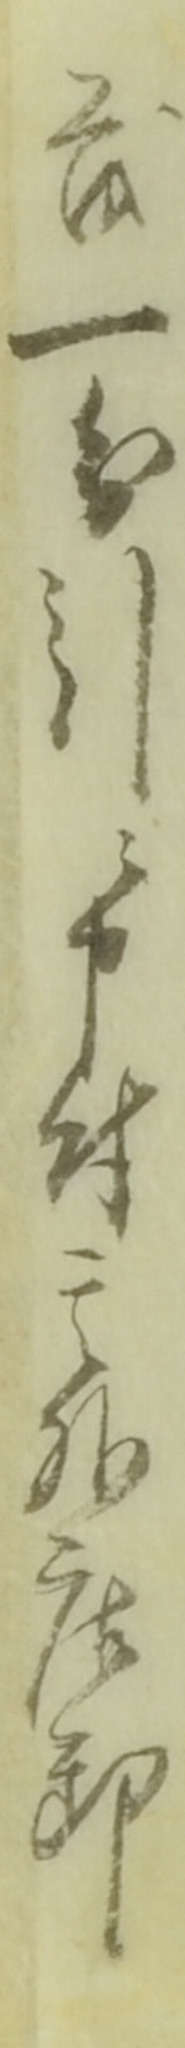茂一分引ニ申付其外店卸

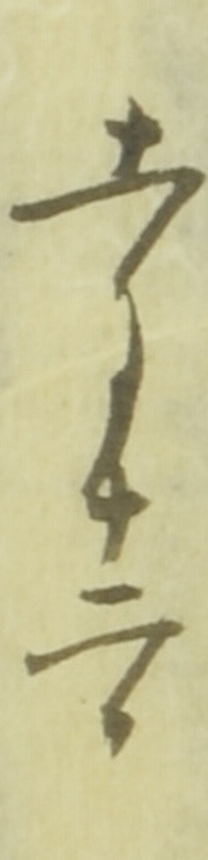十一月十五日
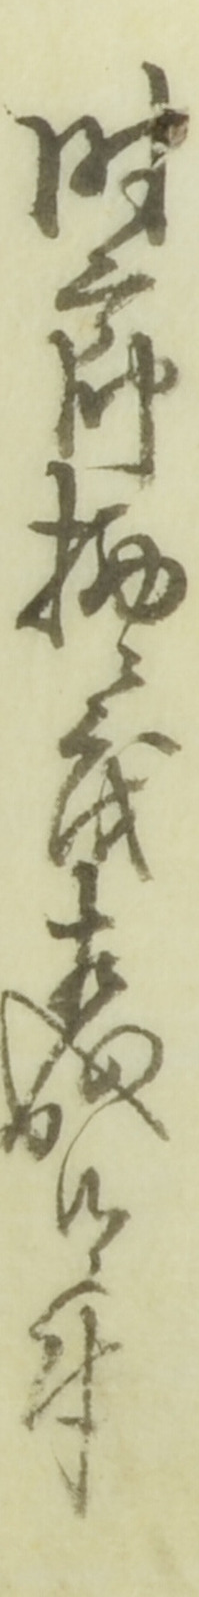時節柄ニ茂相成候ニ付
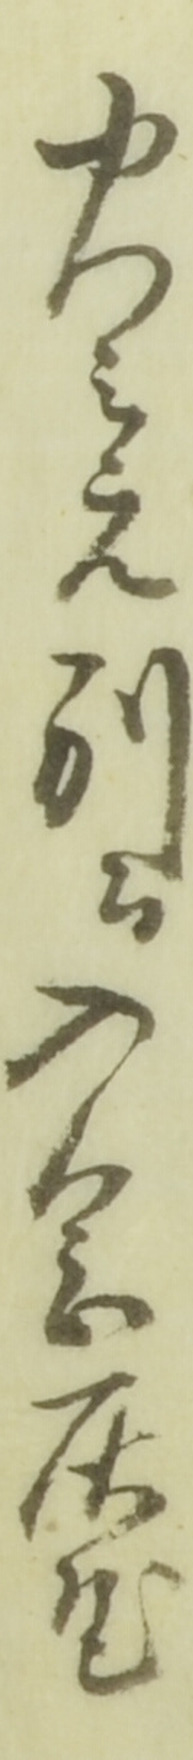火之元別而入念灰屋
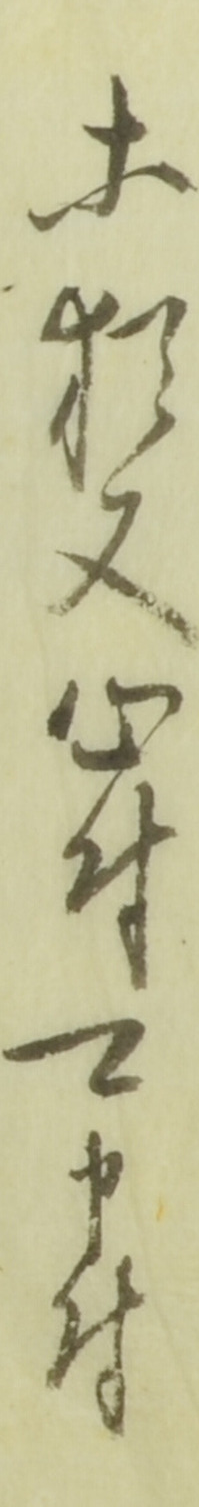等猶又心付可申付
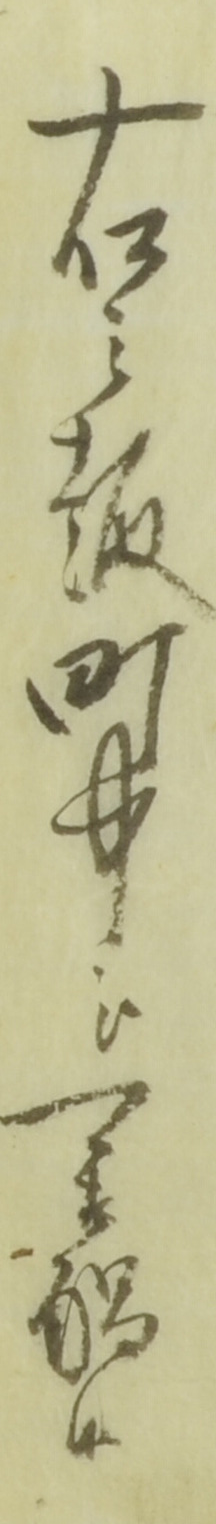右之趣町中被可相触候
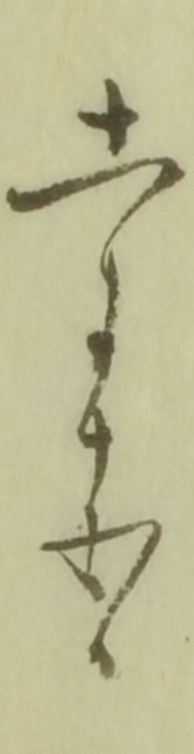十一月十五日
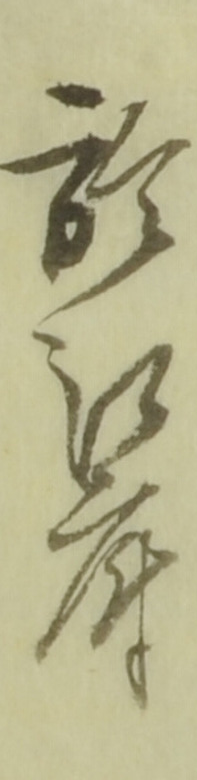於江府
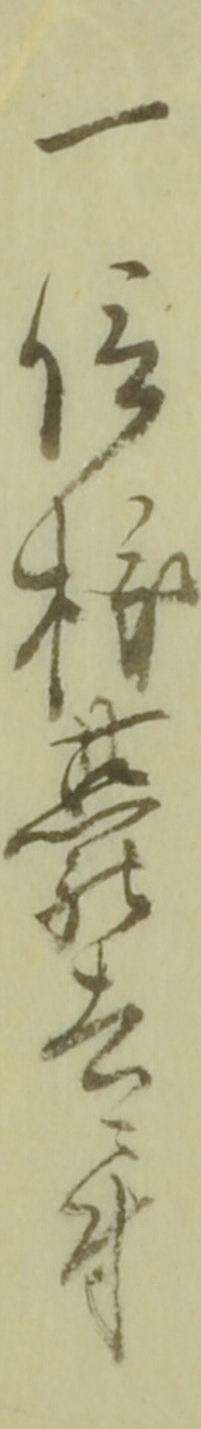一信様薨去ニ付
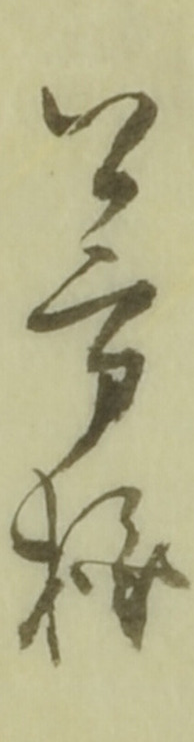公方様
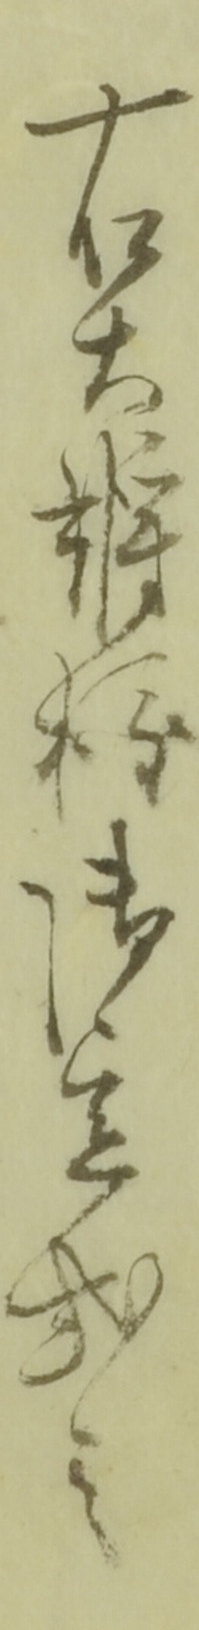右大将様御定式之
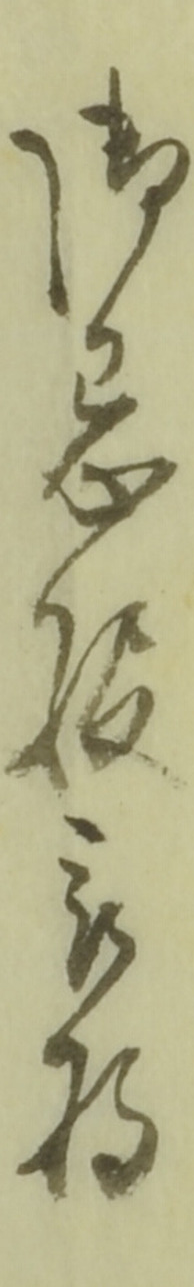御忌服被為
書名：御触書御書附控
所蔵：伊那市立高遠町図書館・合同会社AMANE
